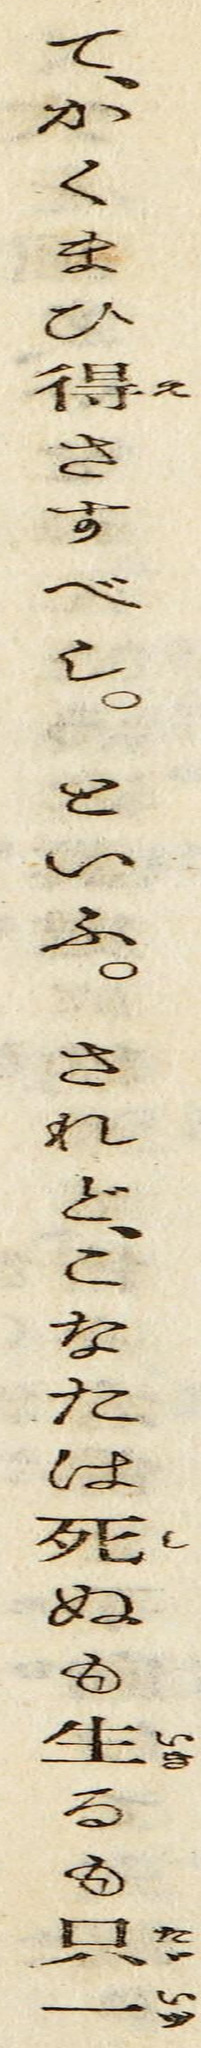て、かくまひ得さすべし。といふ。されど、こなたは死ぬも生るも只一
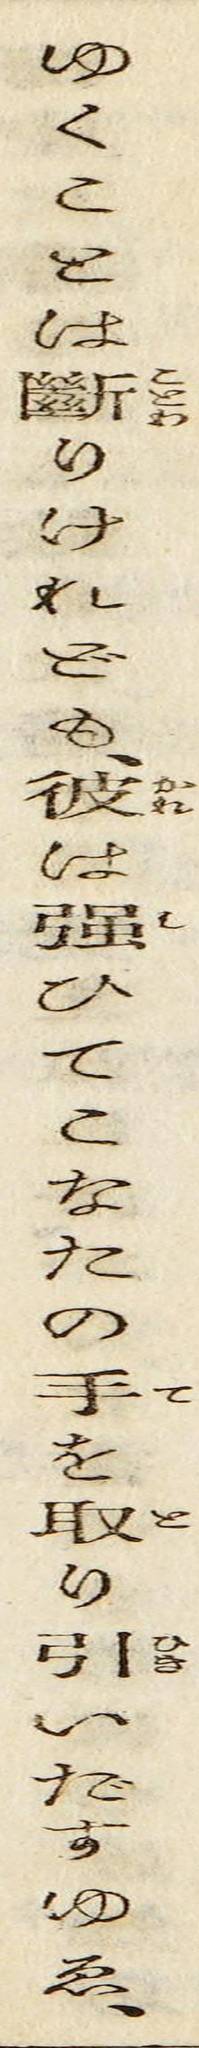ゆくことは断りけれども、彼は強ひてこなたの手を取り引いだすゆゑ、
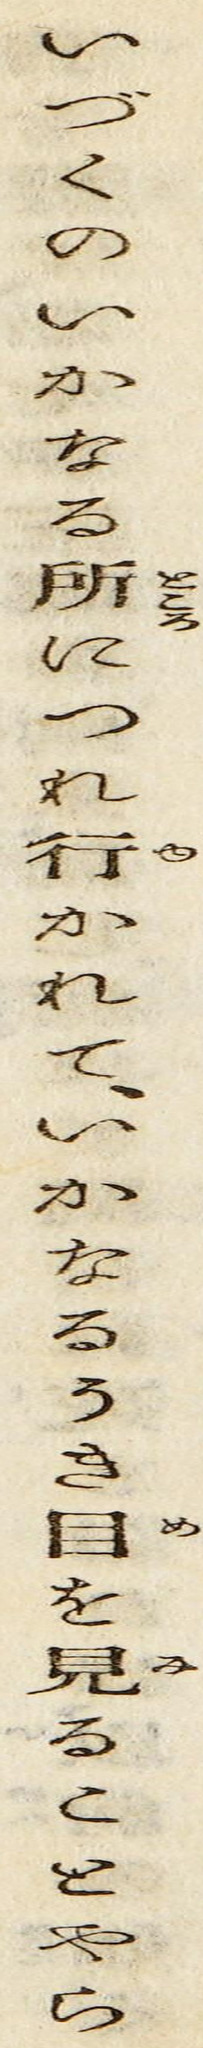いづくのいかなる所につれ行かれて、いかなるうき目を見ることやら
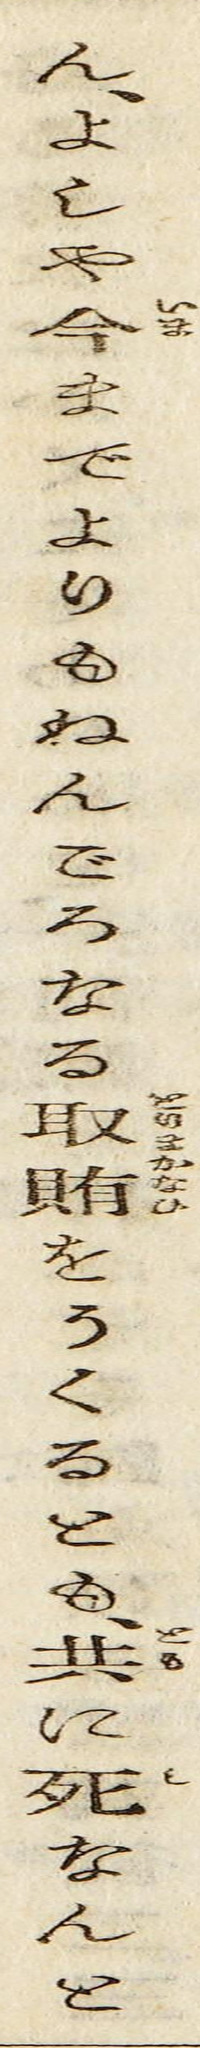ん、よしや今までよりもねんごろなる取賄をうくるとも、共に死なんと
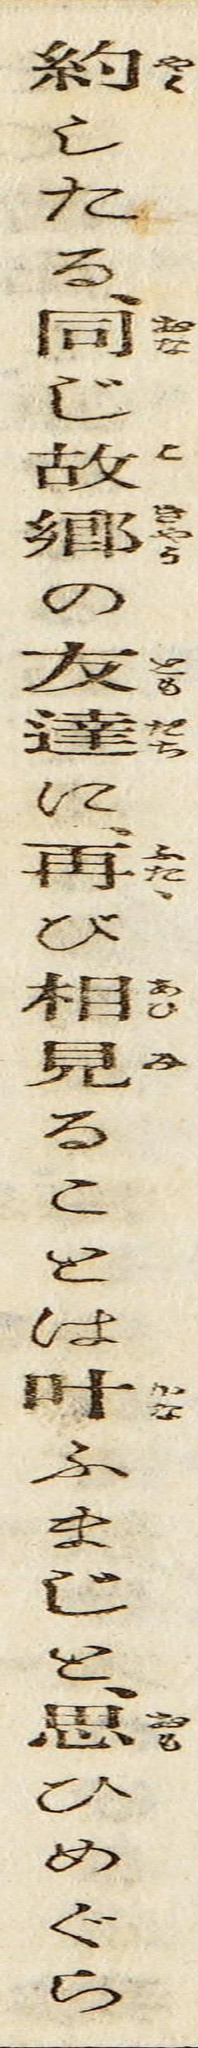約したる、同じ故郷の友達に、再び相見ることは叶ふまじと、思ひめぐら
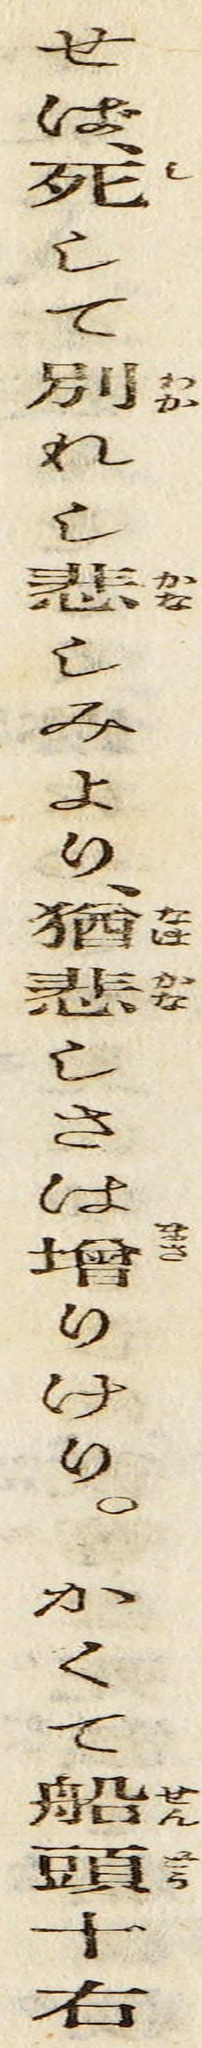せば、死して別れし悲しみより、猶悲しさは増りけり。かくて船頭十右
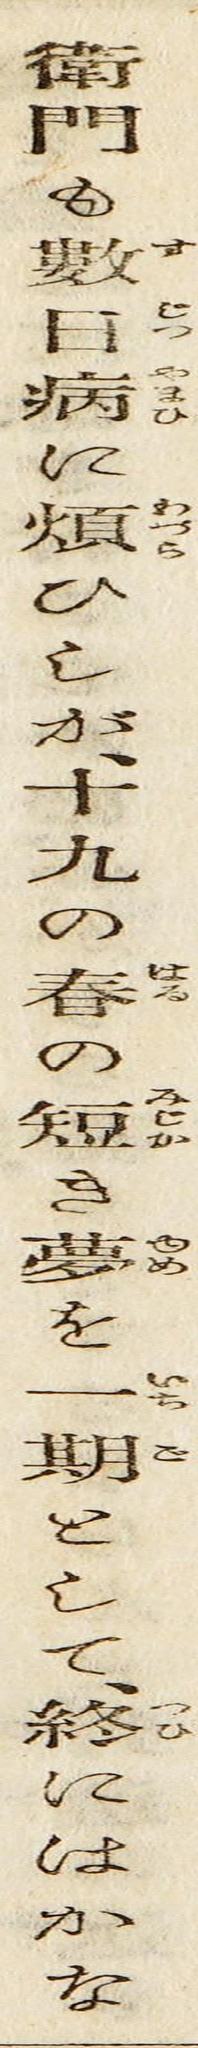衛門も数日病に煩ひしが、十九の春の短き夢を一期として、終にはかな
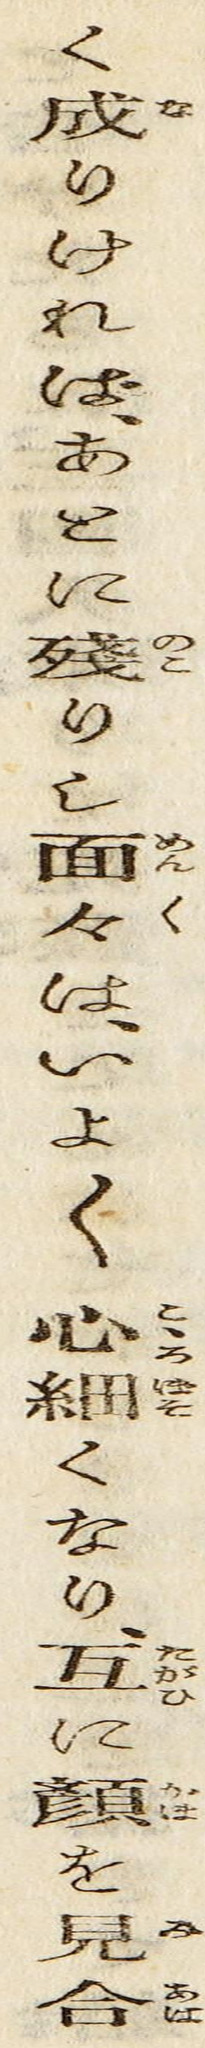く成りければ、あとに残りし面々は、いよ〳〵心細くなり、互に顔を見合
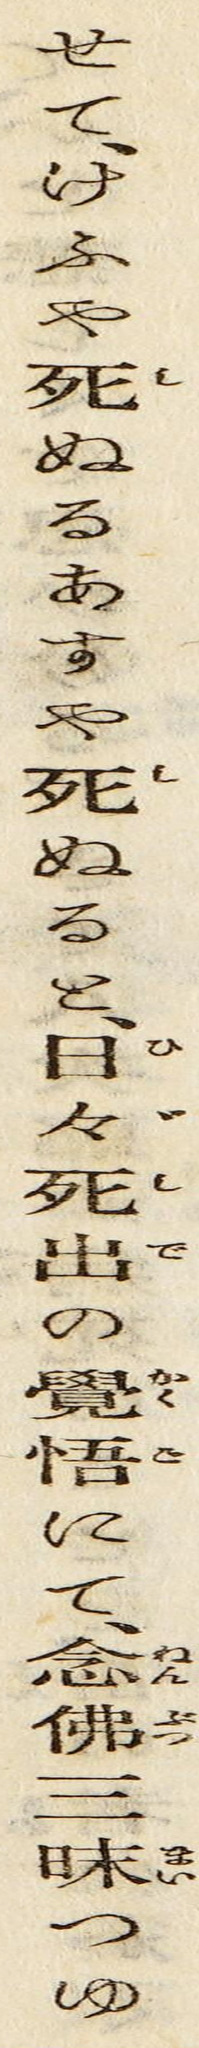せて、けふや死ぬるあすや死ぬると、日々死出の覚悟にて、念仏三昧つゆ
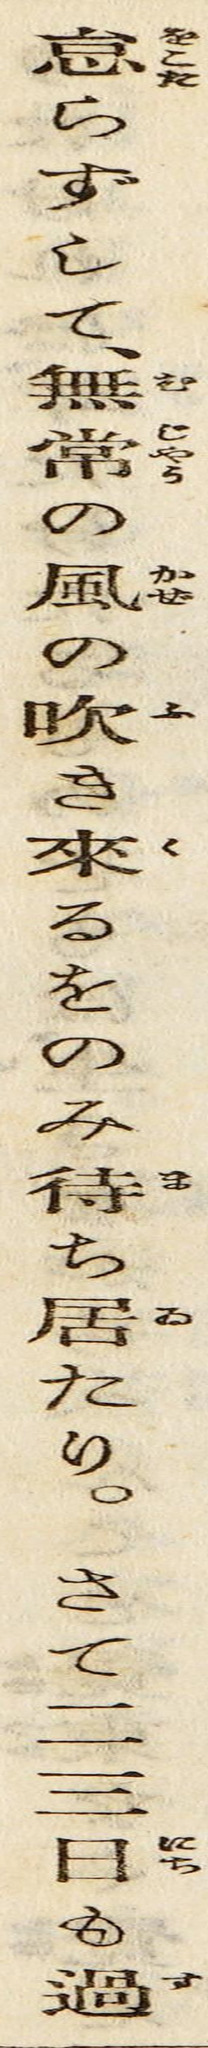怠らずして、無常の風の吹き来るをのみ待ち居たり。さて二三日も過
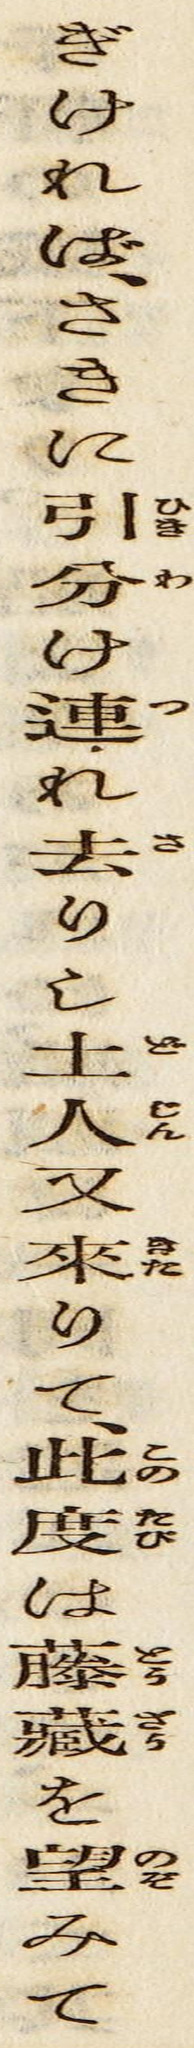ぎければ、さきに引分け連れ去りし土人又来りて、此度は藤蔵を望みて
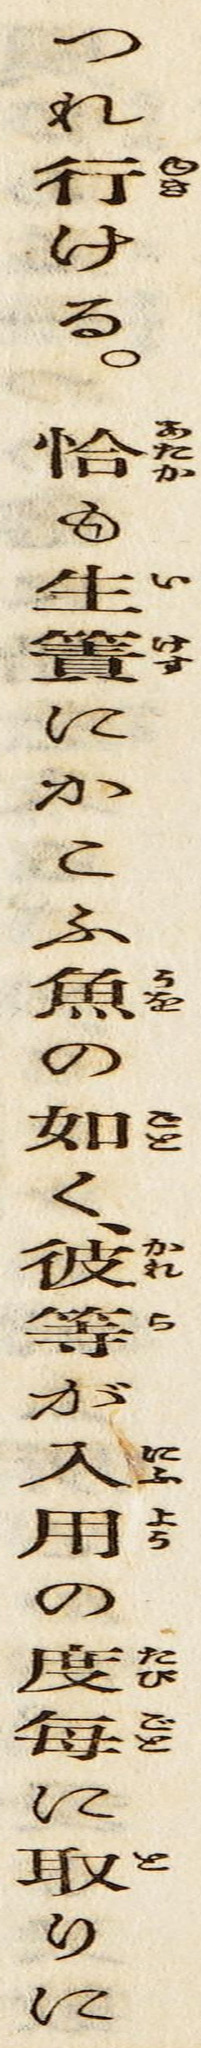つれ行ける。恰も生簀にかこふ魚の如く、彼等が入用の度毎に取りに
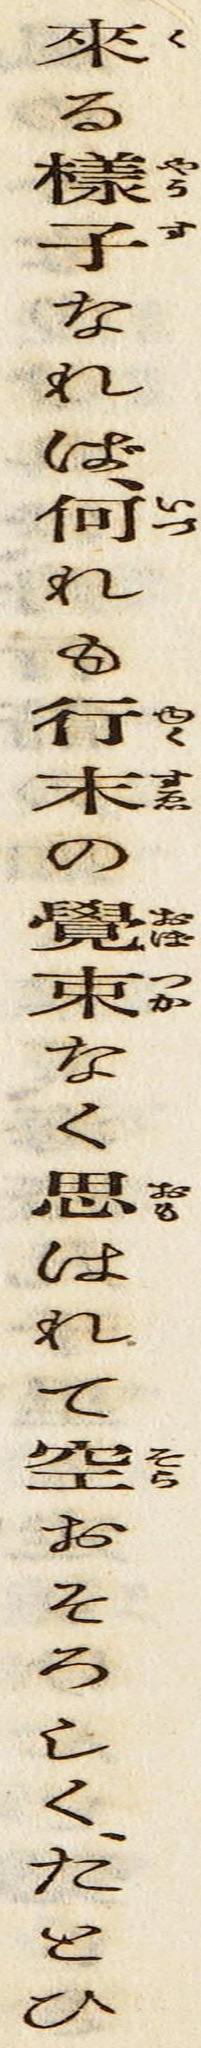来る様子なれば、何れも行末の覚束なく思はれて空おそろしく、たとひ
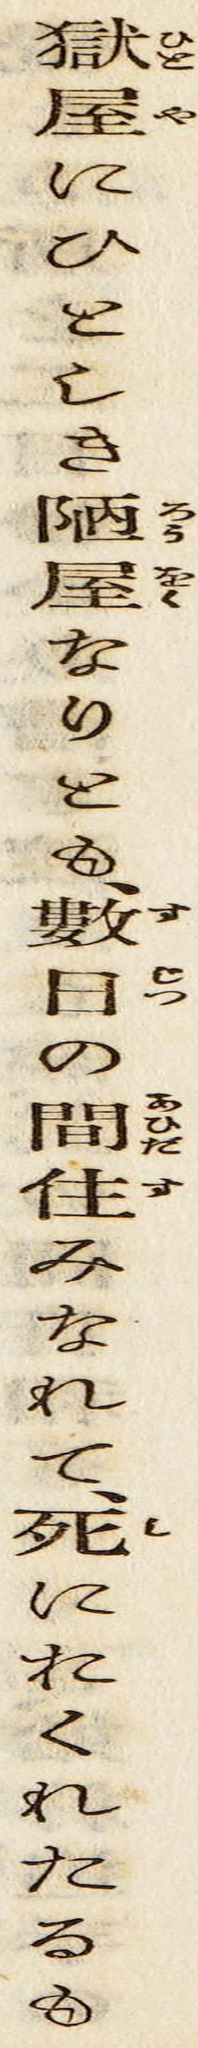獄屋にひとしき陋屋なりとも、数日の間住みなれて、死におくれたるも
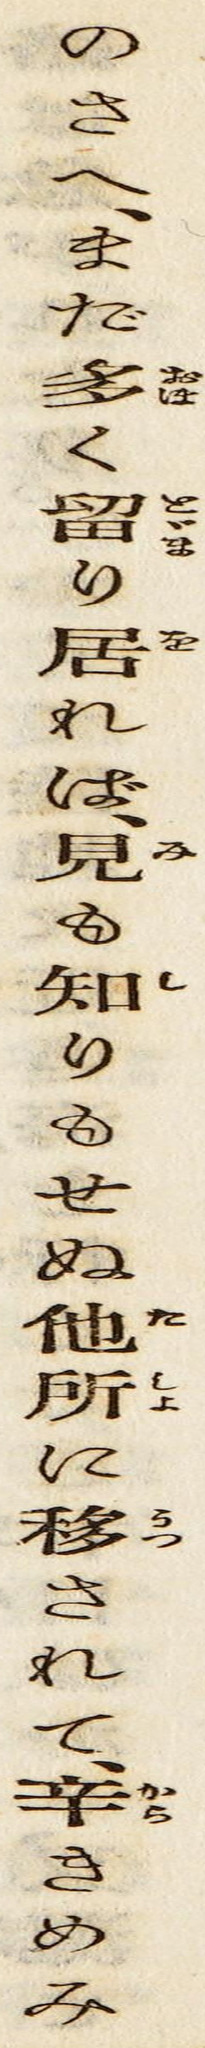のさへ、まだ多く留り居れば、見も知りもせぬ他所に移されて、辛きめみ
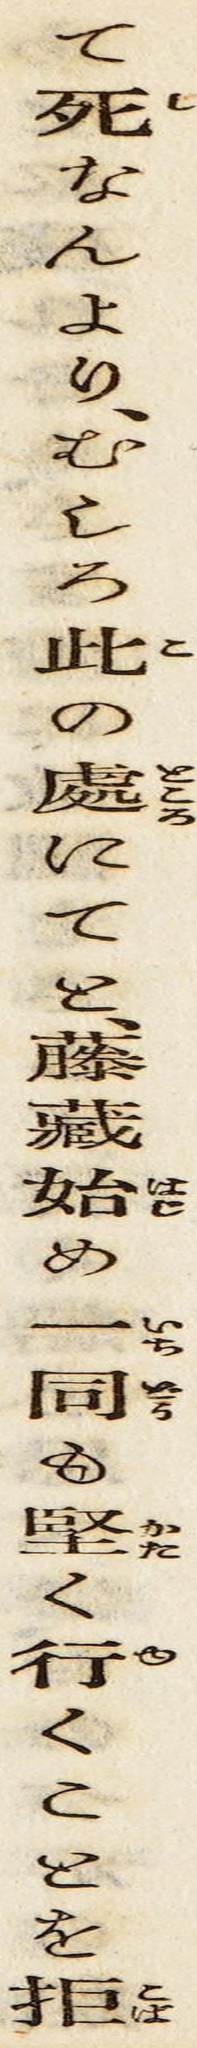て死なんより、むしろ此の処にてと、藤蔵始め一同も堅く行くことを拒
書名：日本漂流譚
